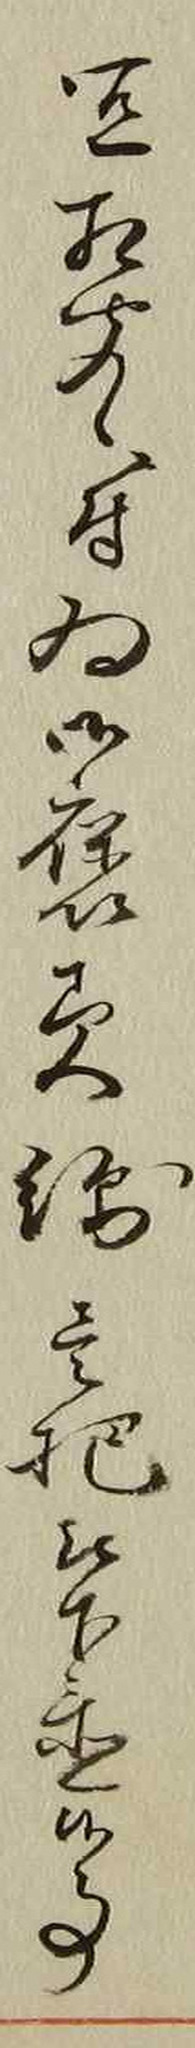宜相聞候に付為御褒美綿壱把被下置候事
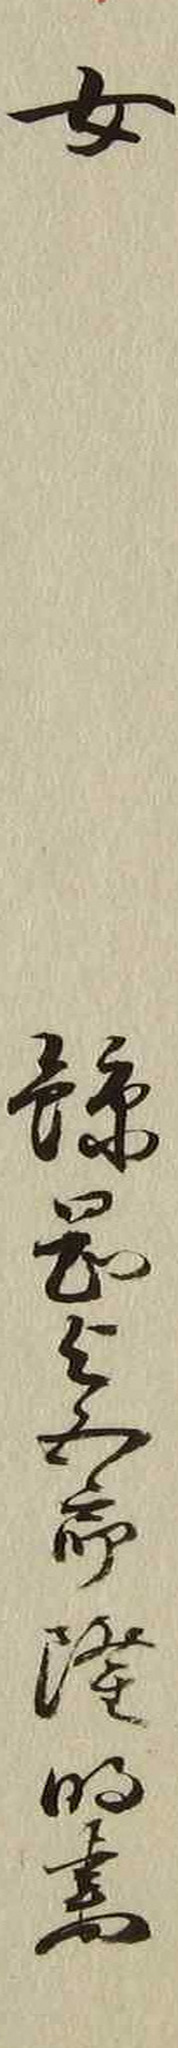女鯨岡与五郎隆明妻
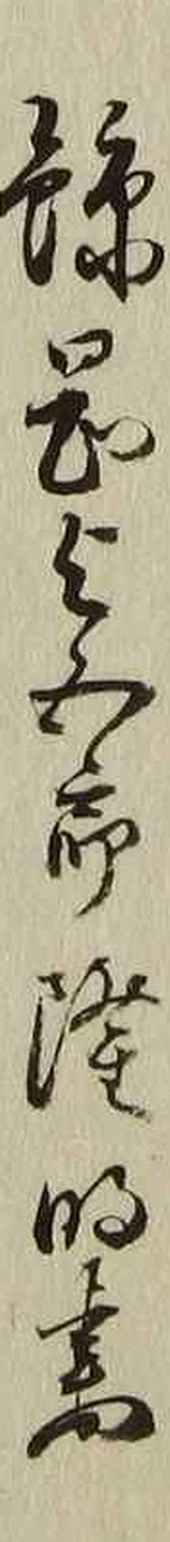女鯨岡与五郎隆明妻
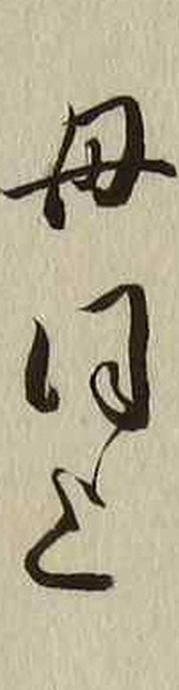母同上
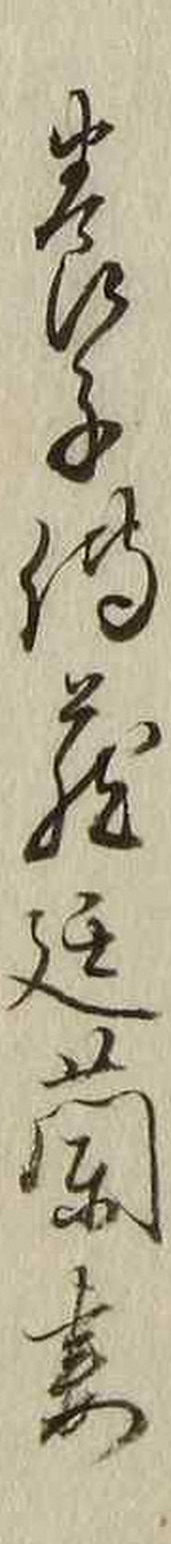女養子傳蔵延蘭妻
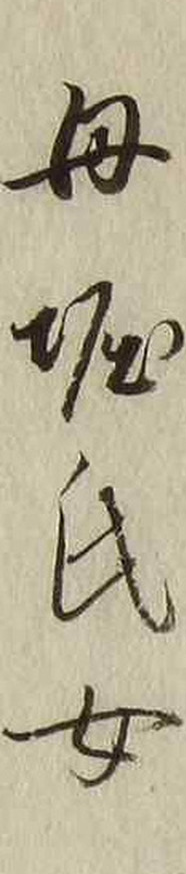母堀氏女

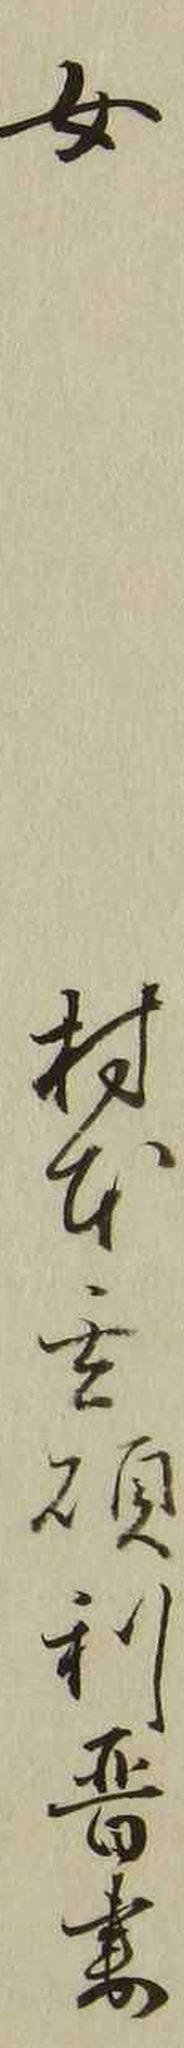女村本玄碩利普妻
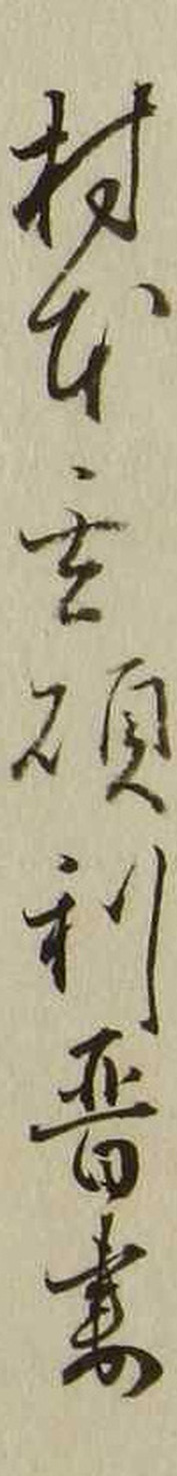女村本玄碩利普妻
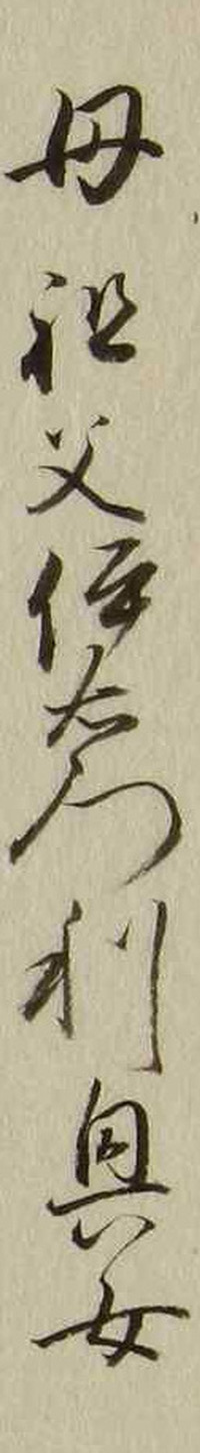母祖父伊右衛門利興女
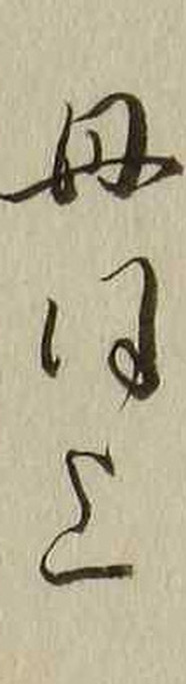母同上
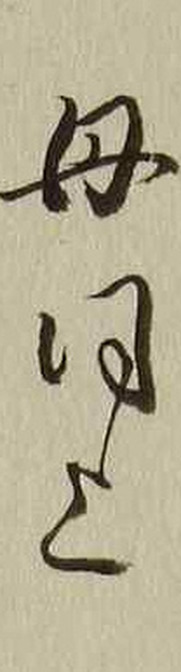母同上
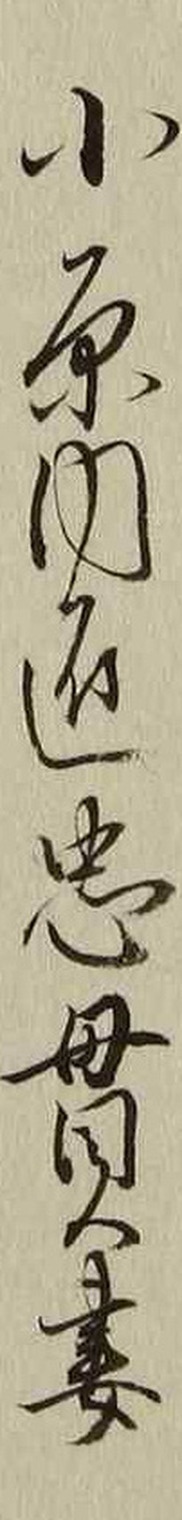女小原内匠忠貫妻
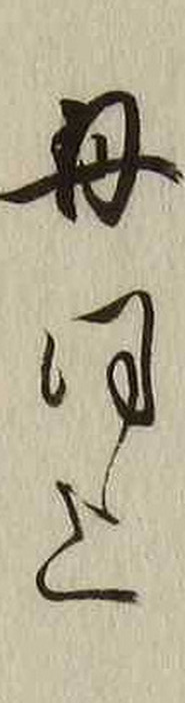母同上
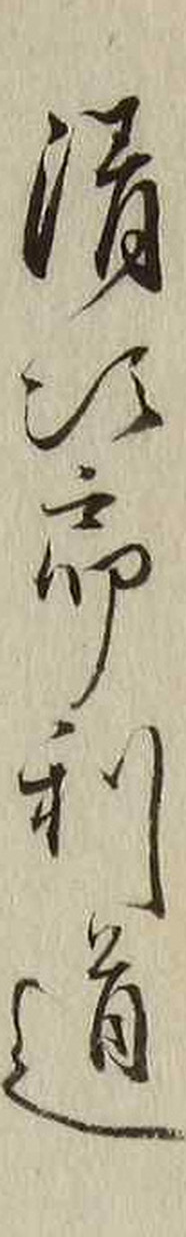清次郎利道
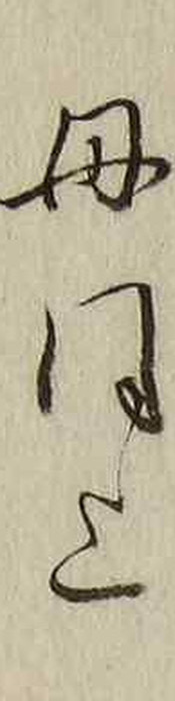母同上

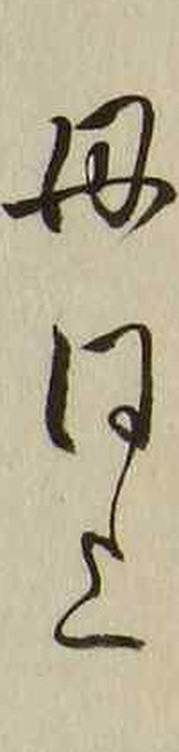母同上
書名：諸士系譜　巻之3　い之部3
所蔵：会津若松市立会津図書館
